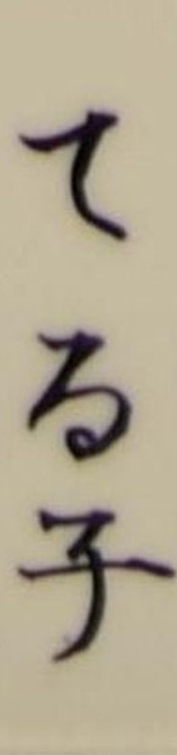てる子
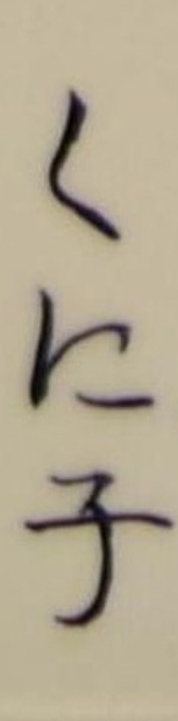くに子
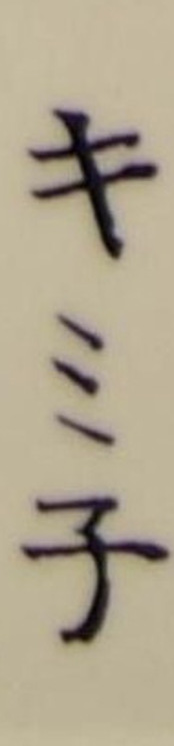キミ子
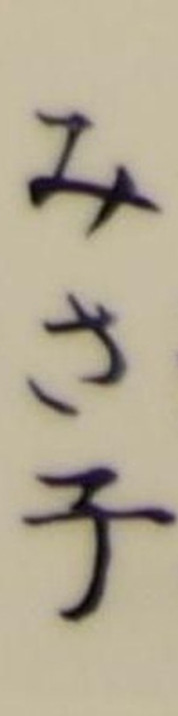みさ子
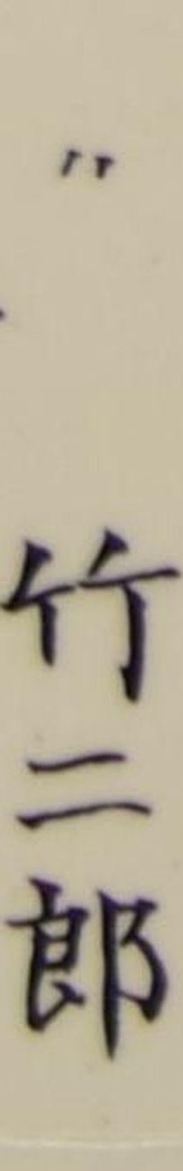竹二郎
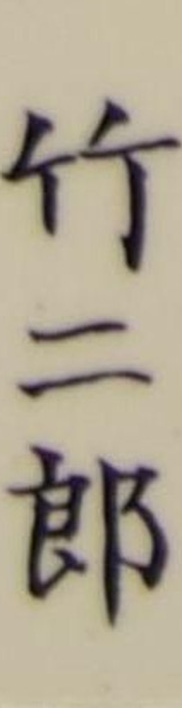竹二郎
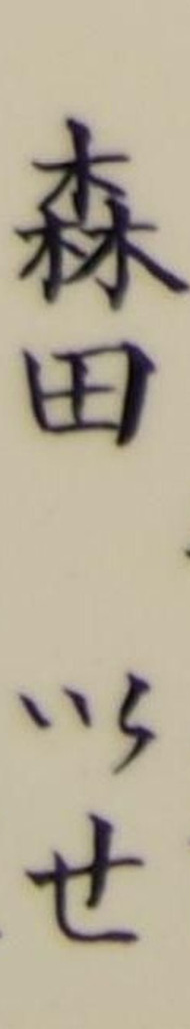森田いせ
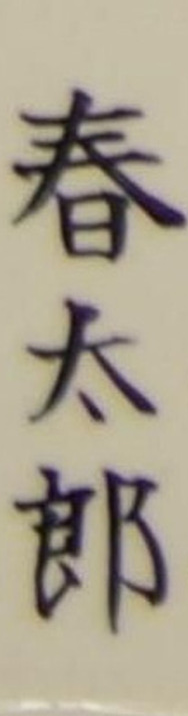春太郎
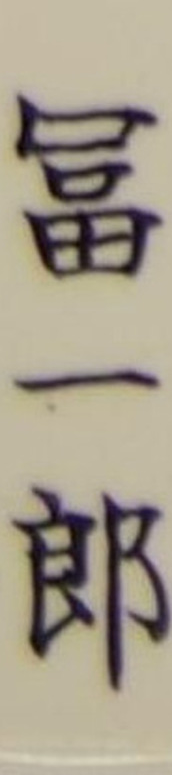冨一郎

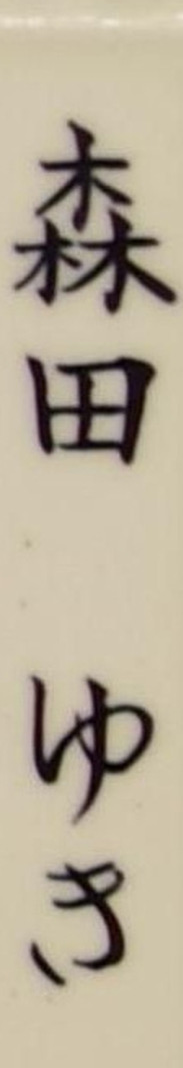森田ゆき
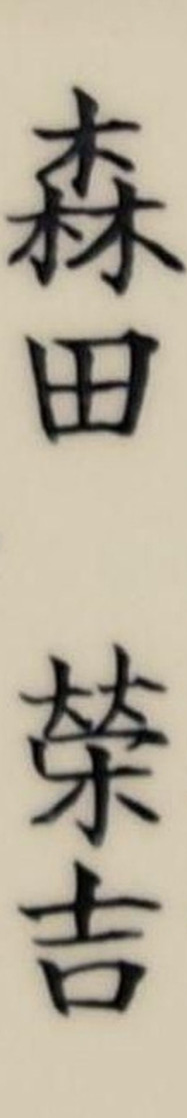森田栄吉
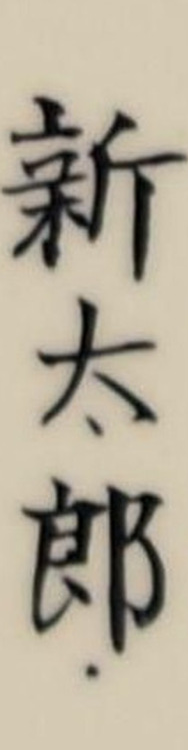新太郎
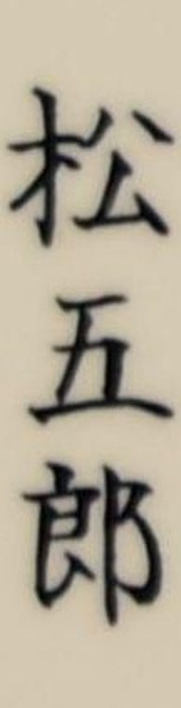松五郎
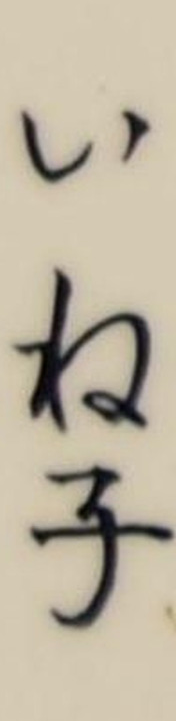いね子
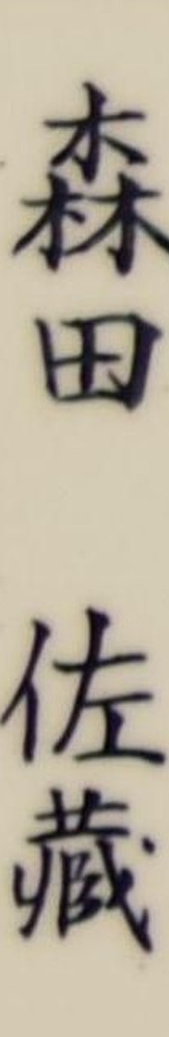森田佐蔵
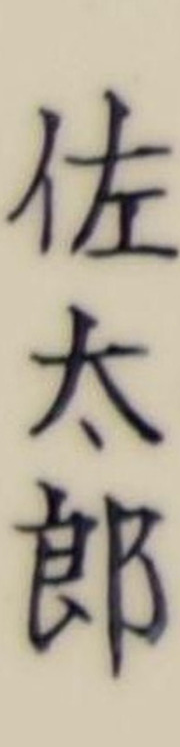佐太郎
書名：A~D
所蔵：koyasan kongobuji
